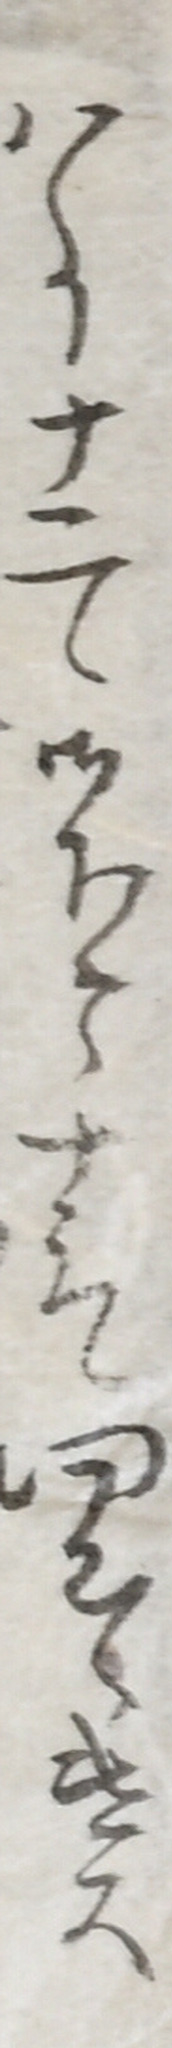八月十二日御下ニ而十三日問屋へ遣ス
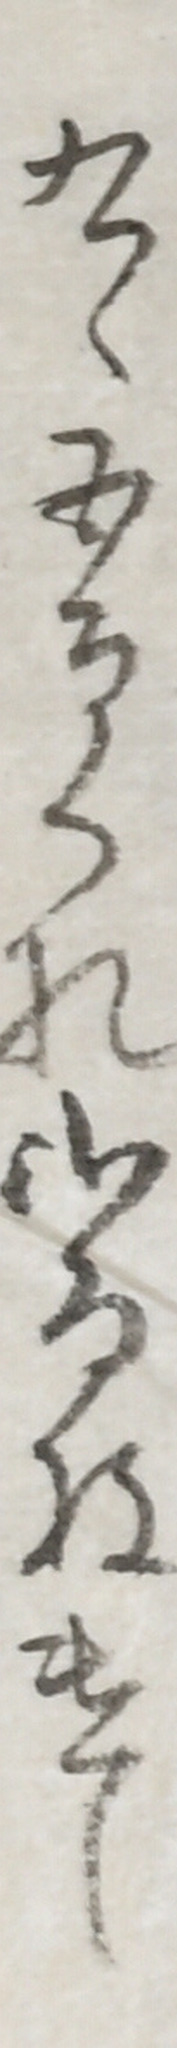九日百ちくれ弐百枚遣し
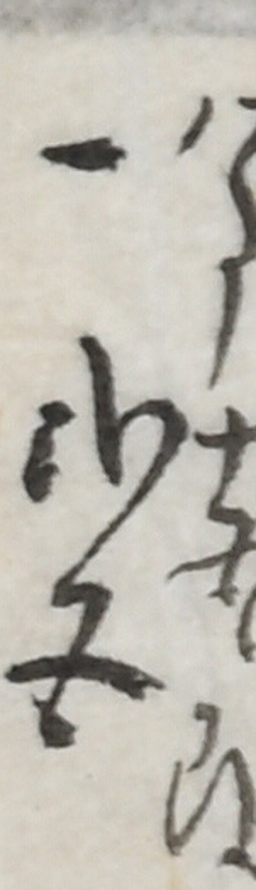一弐五
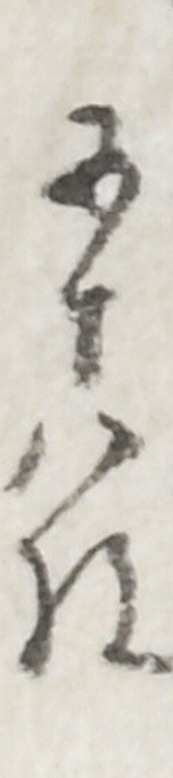五十八枚
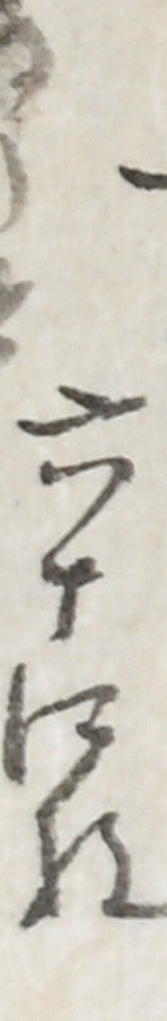六十四枚
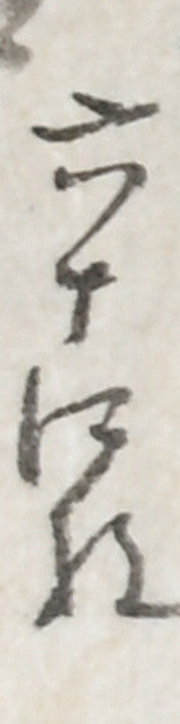六十四枚
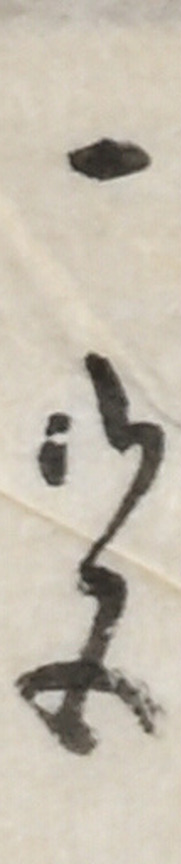一弐五
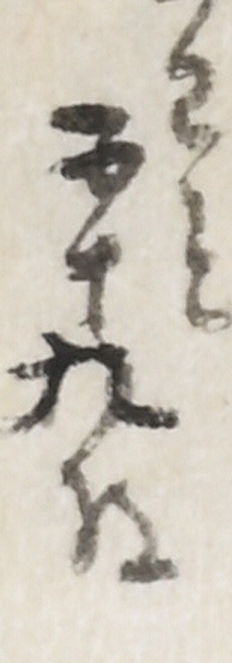五十九枚
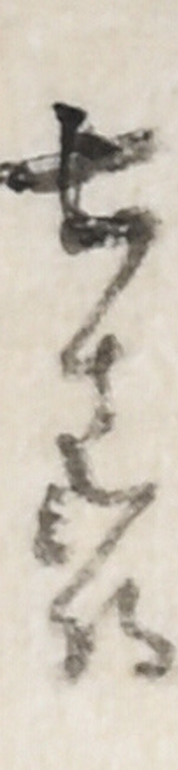七十弐枚
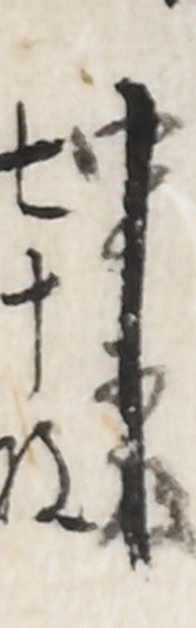七十枚
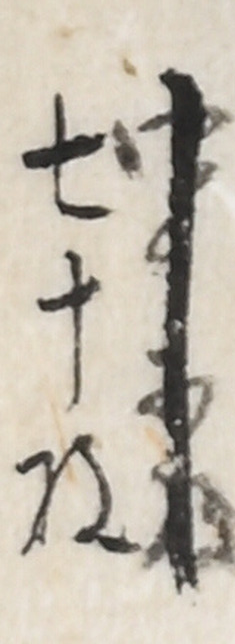七十枚
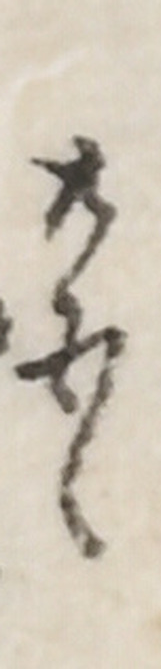廿五日
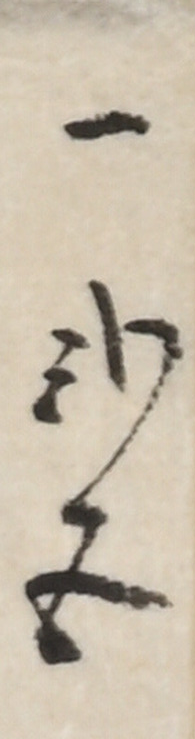一弐五
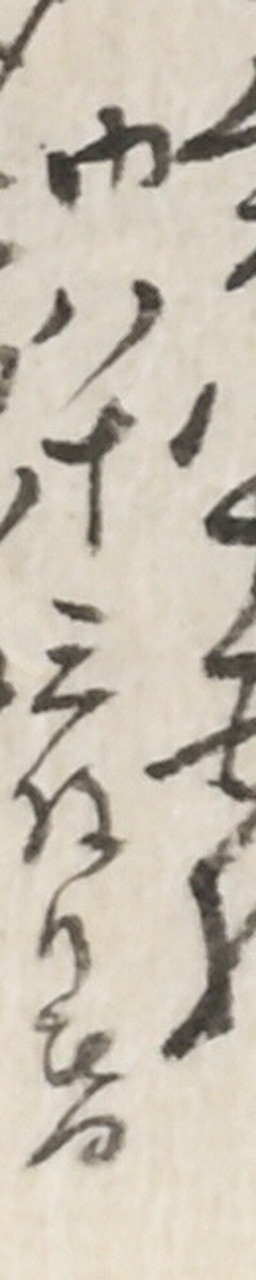内八十三枚引有る
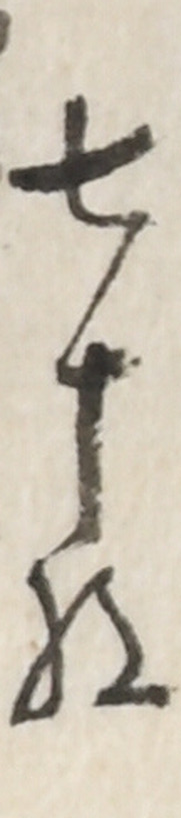七十枚
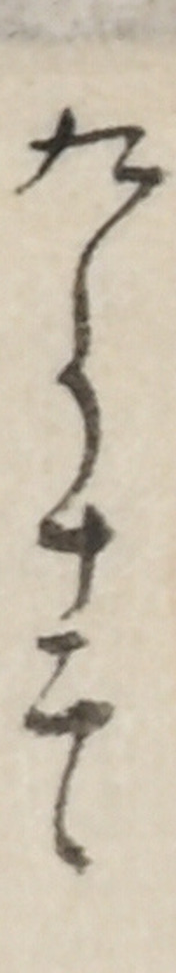九月十二日
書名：覚
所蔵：伊那市立高遠町図書館・合同会社AMANE
